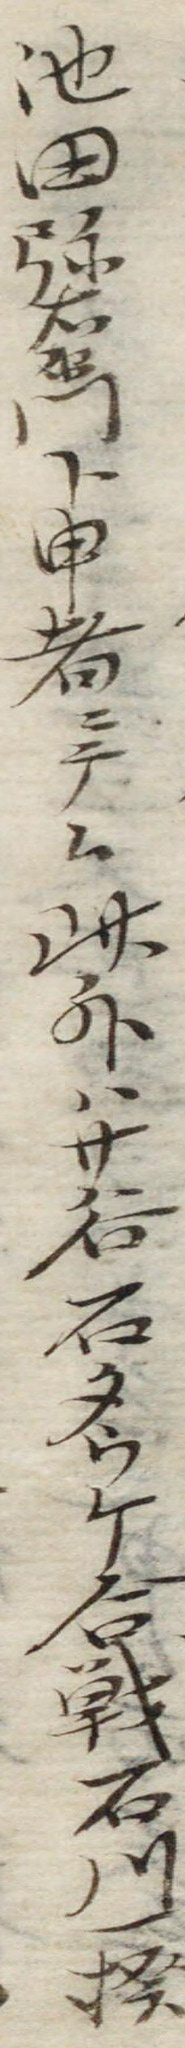池田弥右衛門ト申者ニテ候此外ハサ谷石タウケ合戦石川一揆
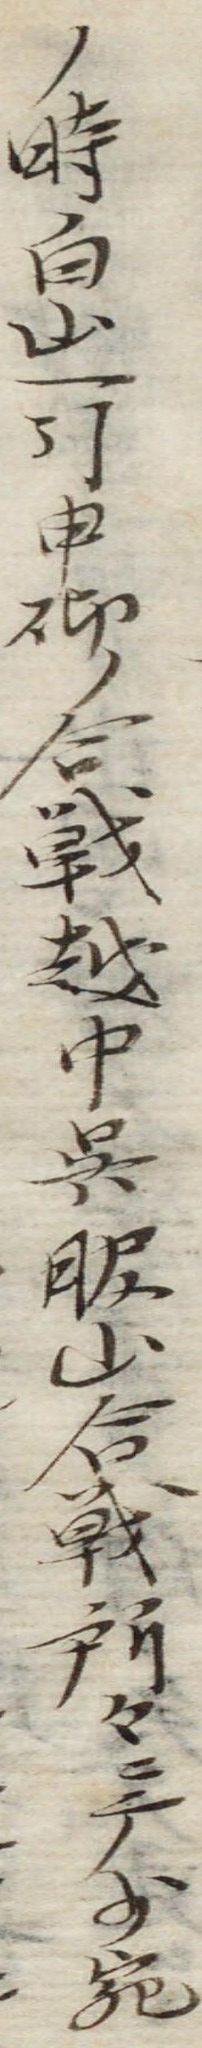ノ時白山へ引申砌ノ合戦越中呉服山合戦所々ニテ少宛
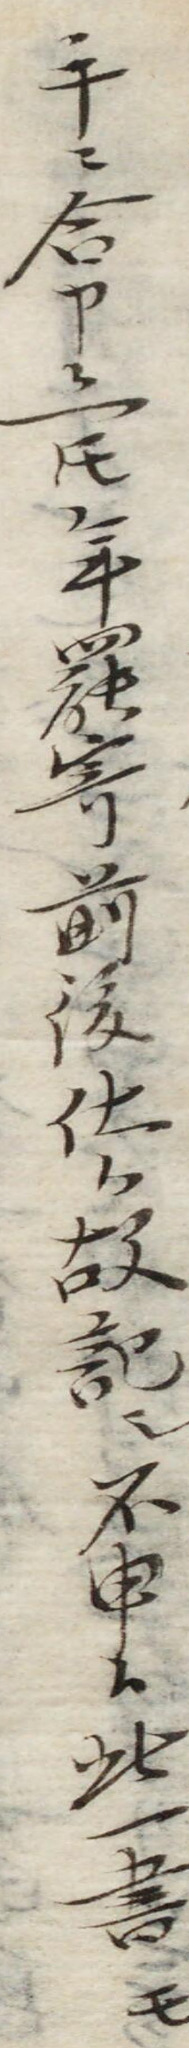手ニ合申候へトモ年罷寄前後仕候故記シ不申候此一書モ
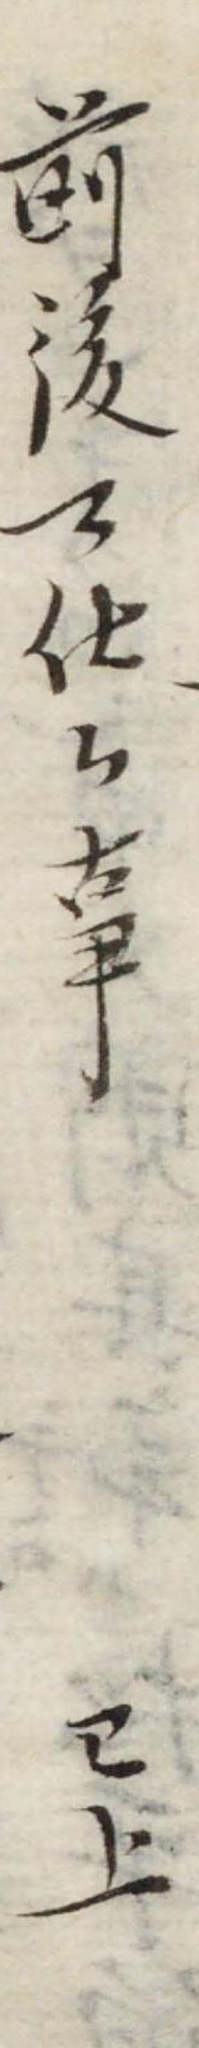前後可仕候事已上
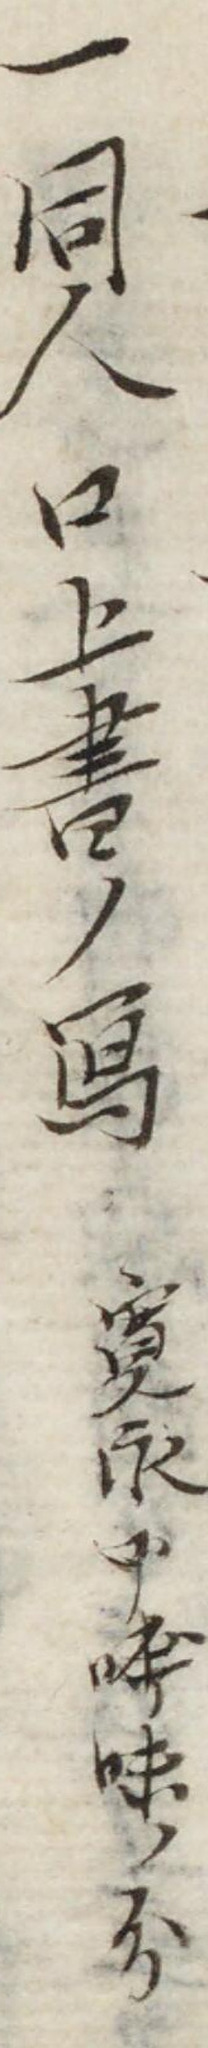一同人口上書ノ写寛永中味ノ分
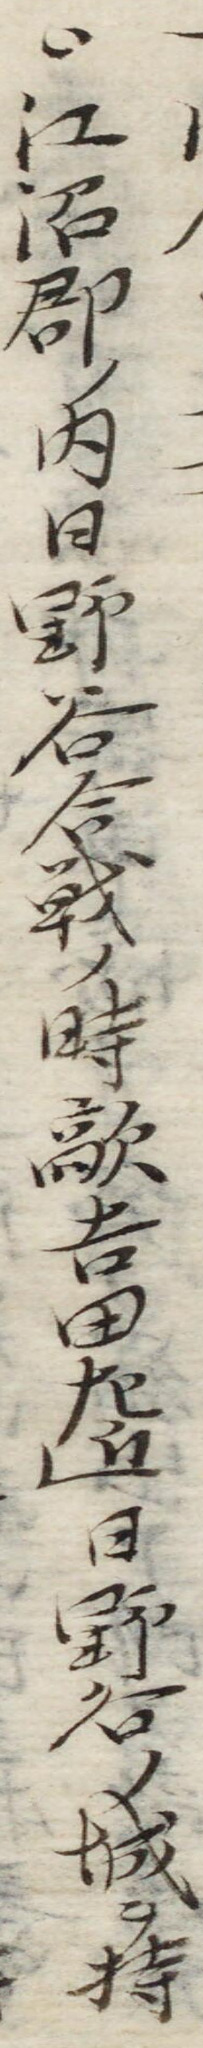〇江沼郡ノ内日野谷合戦ノ時敵吉田左近日野谷ノ城ヲ持
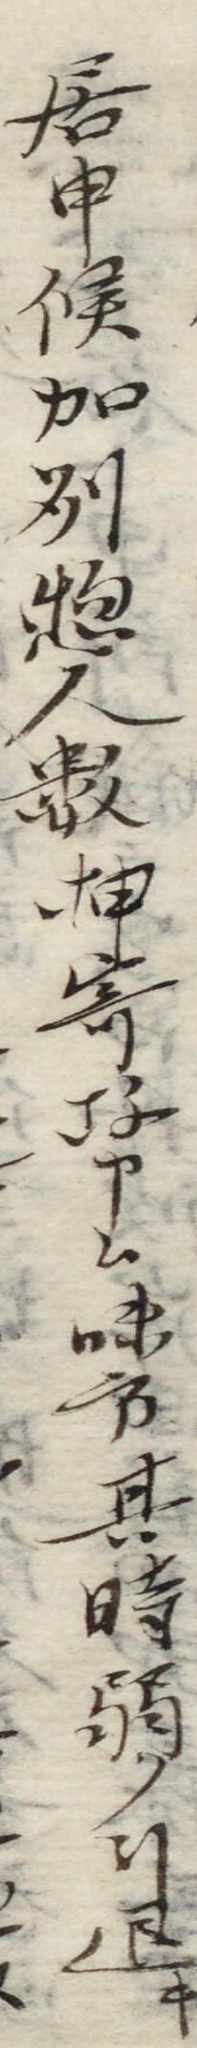居申候加州惣人數押寄攻申候味方其時弱ク引退キ
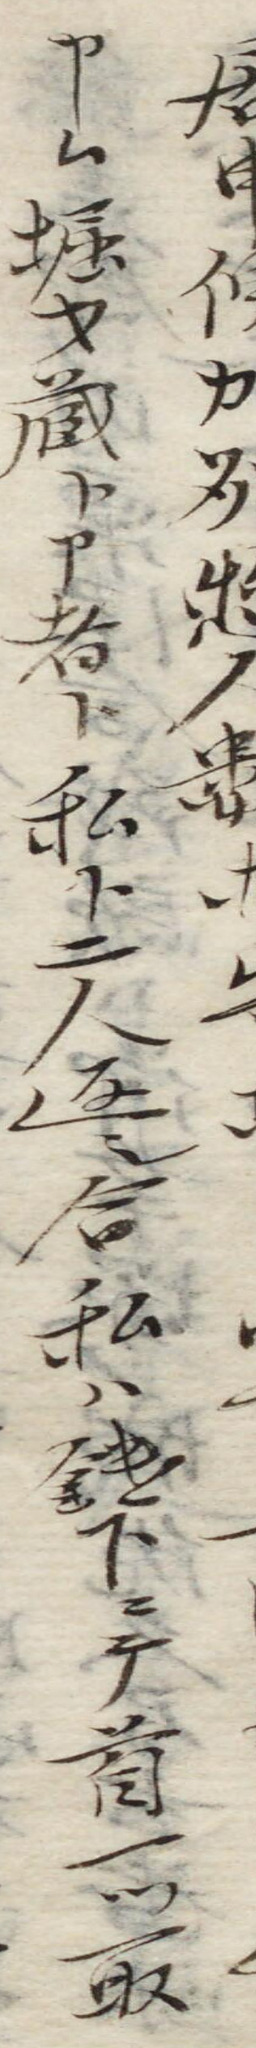申候堀才蔵ト申者ト私ト二人返シ合私ハ鑓下ニテ首一ツ取
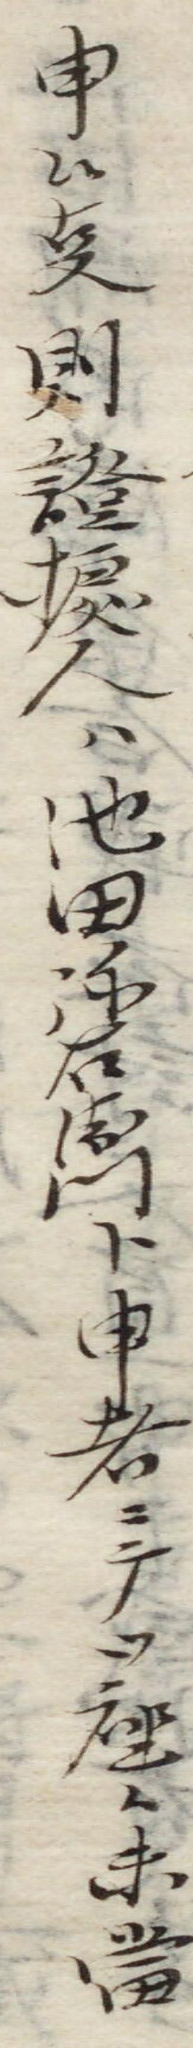申候事則証拠人ハ池田弥右衛門ト申者ニテ御座候未当
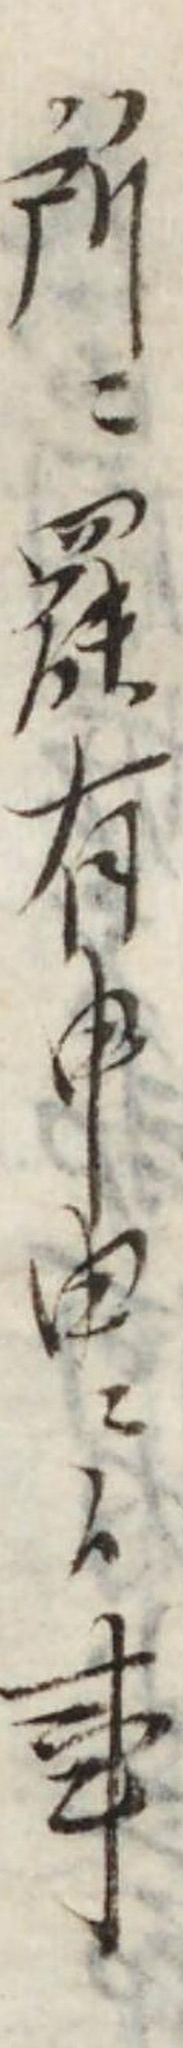所ニ罷有申由ニ候事
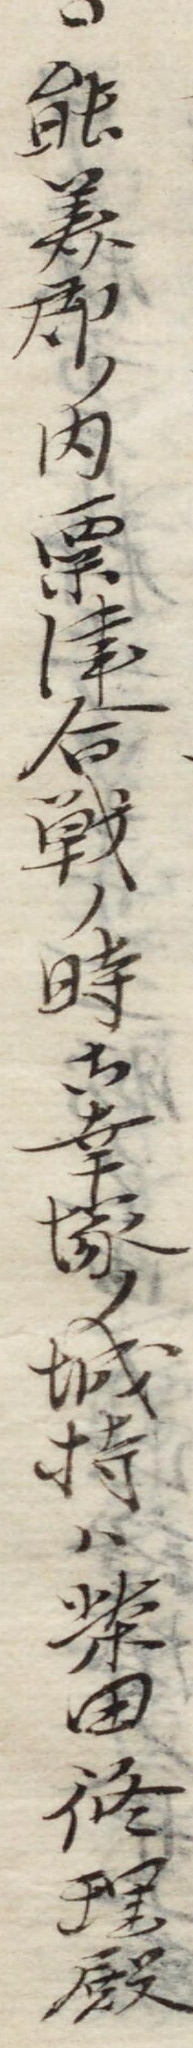〇能美郡ノ内粟津合戦ノ時御幸塚ノ城持ハ柴田修理殿
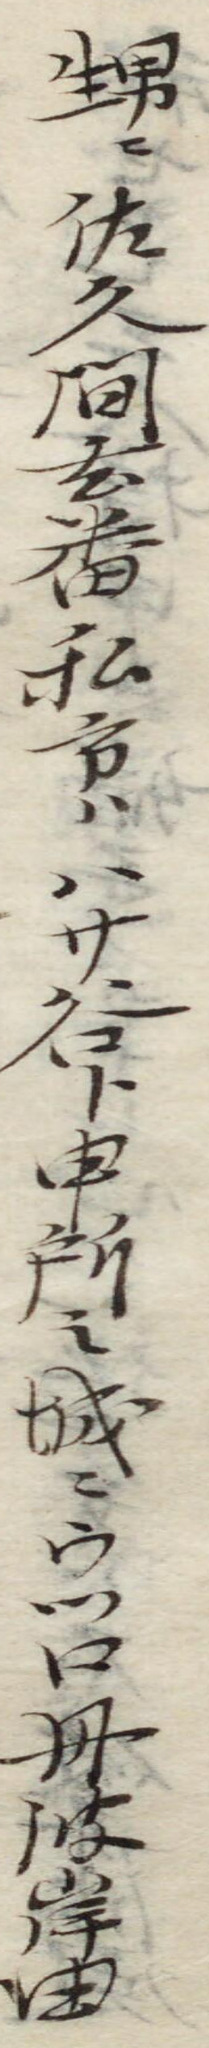甥ニ佐久間玄蕃私方ハハサ谷ト申所之城ニウツロ丹波岸田
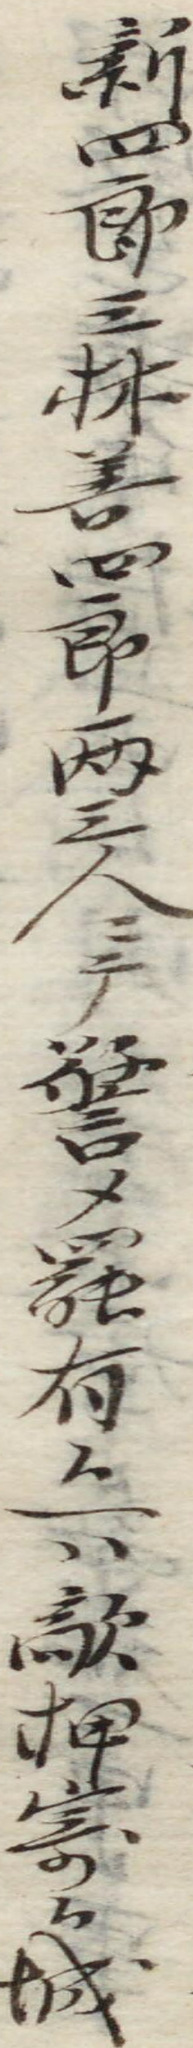新四郎三林善四郎両三人二テ警メ罷有候ヘハ敵押寄候城
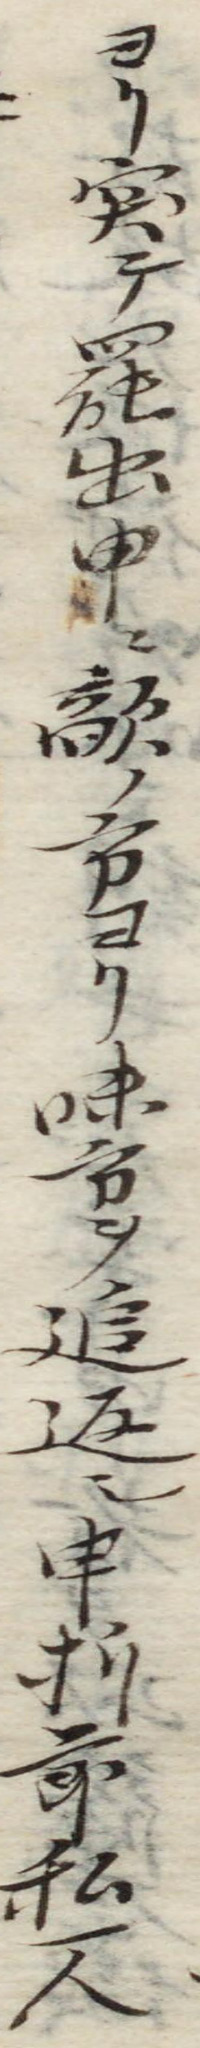ヨリ突テ罷出申ニ敵ノ方ヨリ味方ヲ追返シ申折節私一人
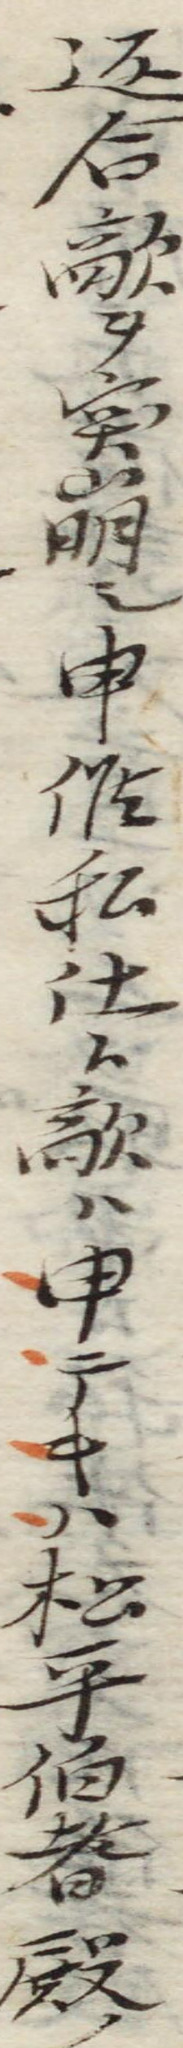返合敵ヲ突崩シ申候私仕候敵ハ申テキㇵ松平伯耆殿ノ
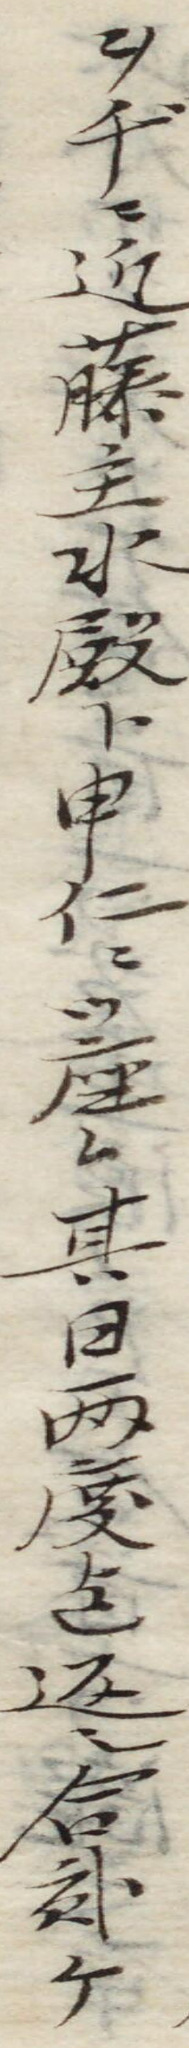ヲヂニ近藤主水殿ト申仁ニ御座候其日両度迄返シ合弐ケ
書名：聞見雑録
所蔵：Ishikawa Prefectural Library
